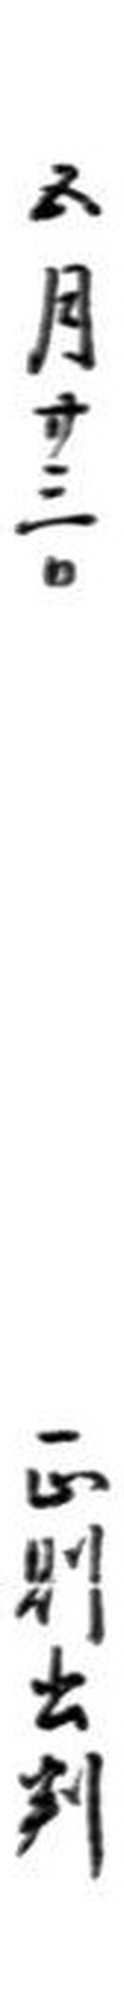五月廿三日正則書判
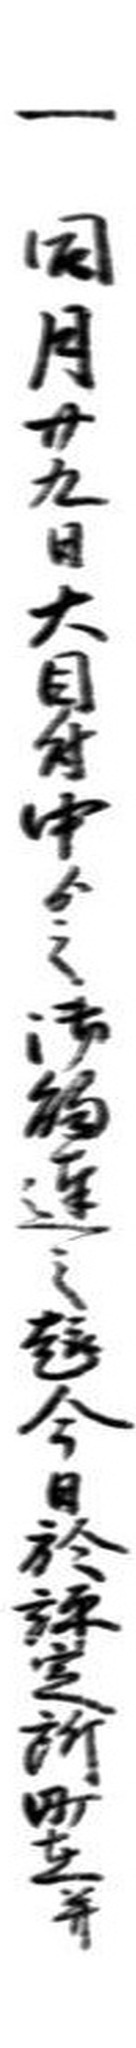一同月廿九日大目付中ゟ之御触達之趣今日於評定所町在并
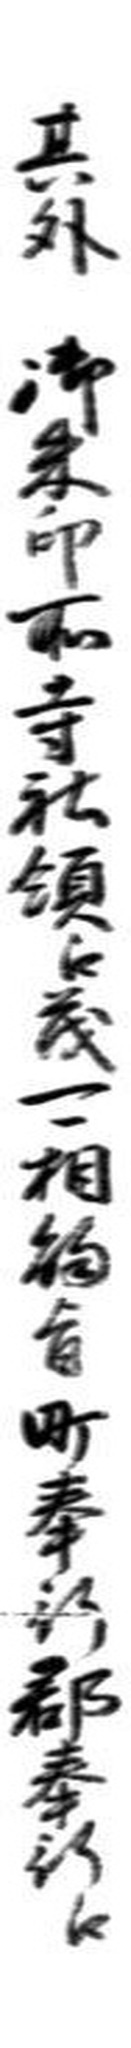其外御朱印所寺社領江茂可相触旨町奉行郡奉行江
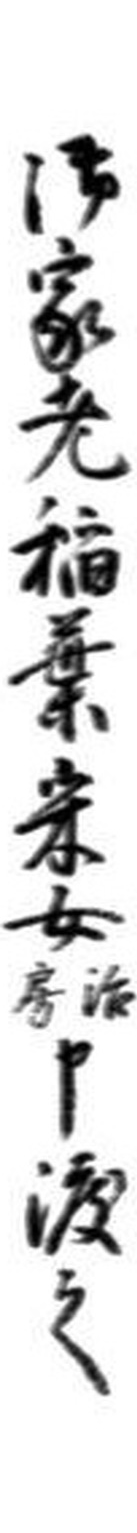御家老稲葉采女治房申渡之

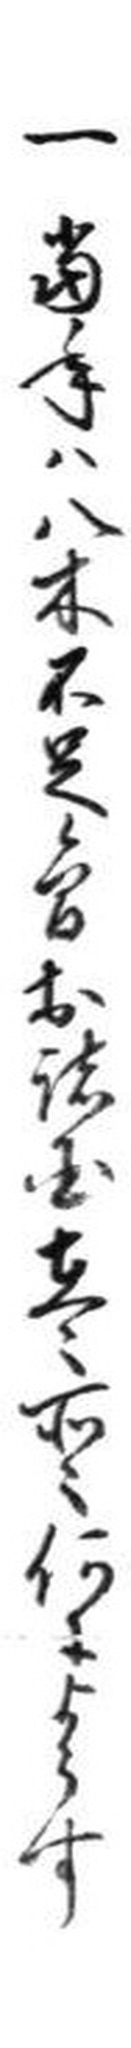一当年は八木不足候間於諸国在々所々何によらす
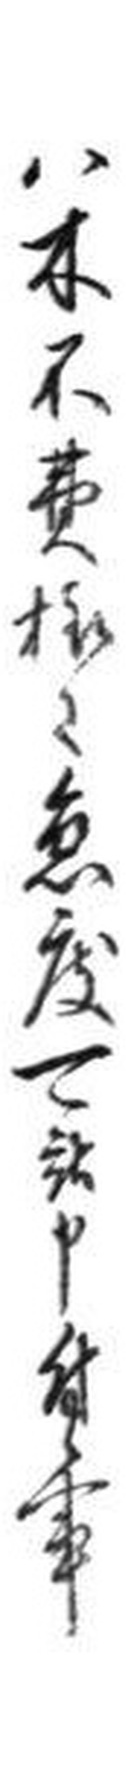八木不費様ニ急度可被申付候事
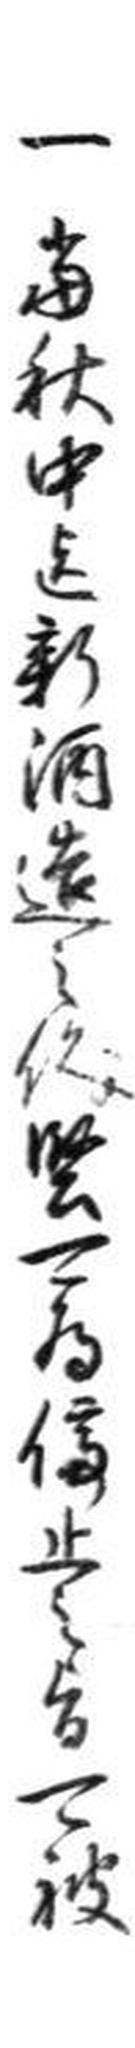一当秋中迄新酒造之儀堅可為停止之旨可被
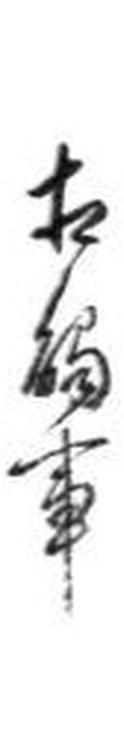相触事
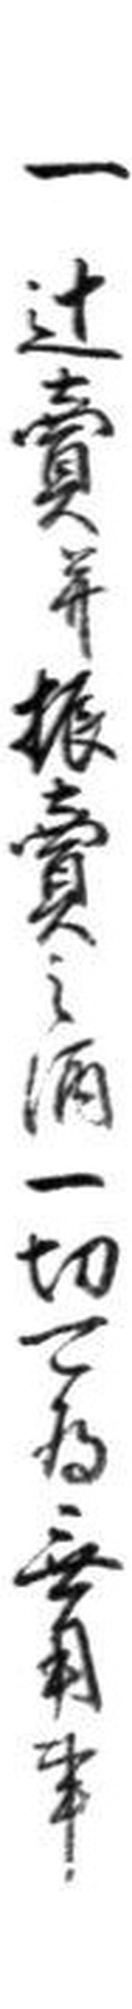一辻売并振売之酒一切可為無用事
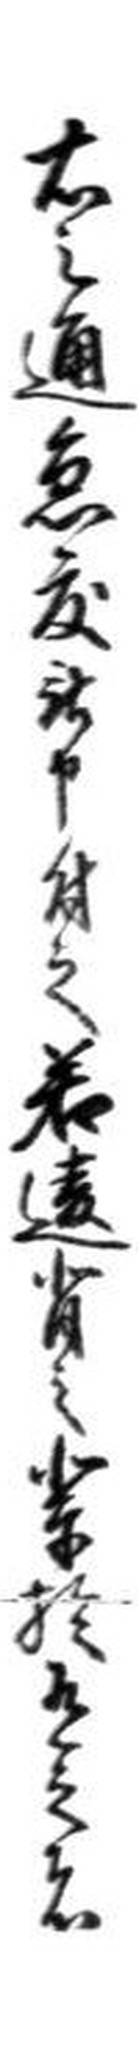右之通急度被申付之若違背之輩於有之者
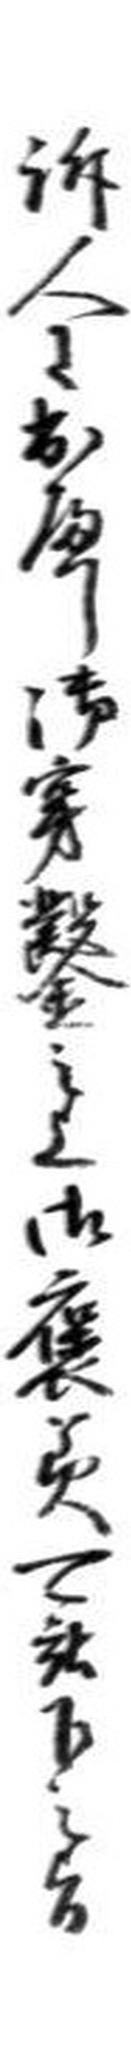訴人に出へし御穿鑿之上御褒美可被下之旨
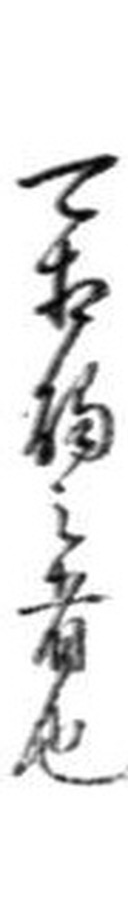可相触之者也
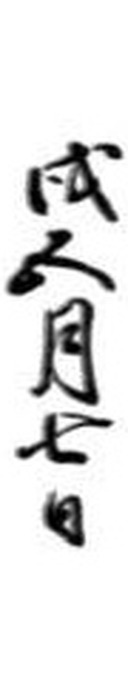戌五月七日
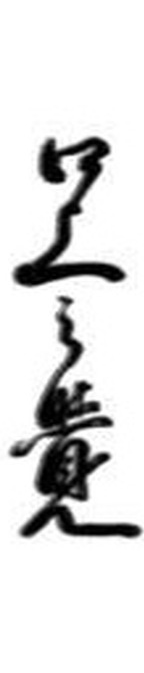口上之覚
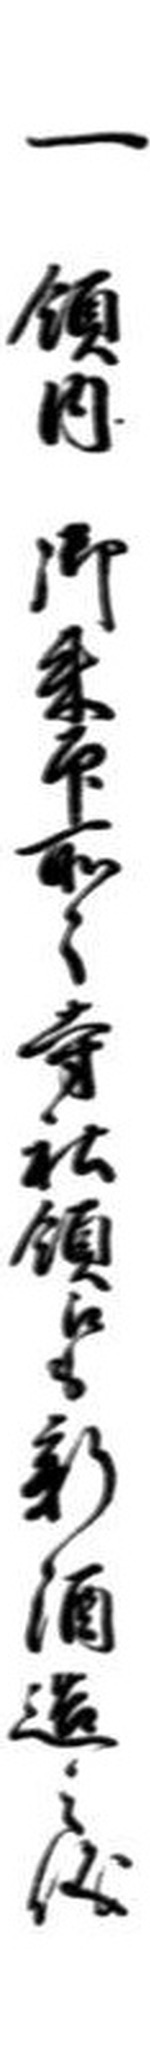一領内御朱印所々寺社領江も新酒造之儀
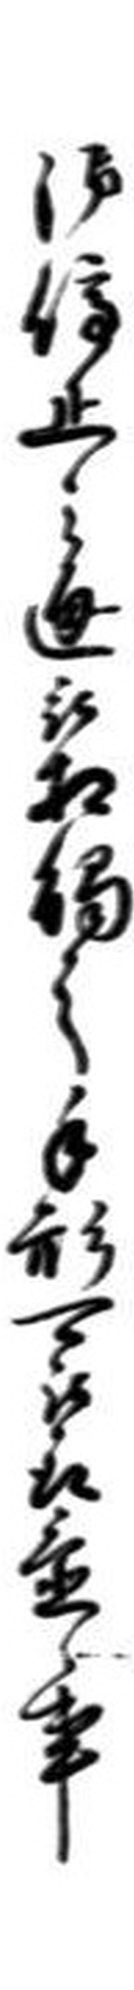御停止之通被相触之手形可被取置候事
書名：家譜 八 光通公 従寛文十年到同十二年
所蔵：福井県文書館 Fukui Prefectural Archives
